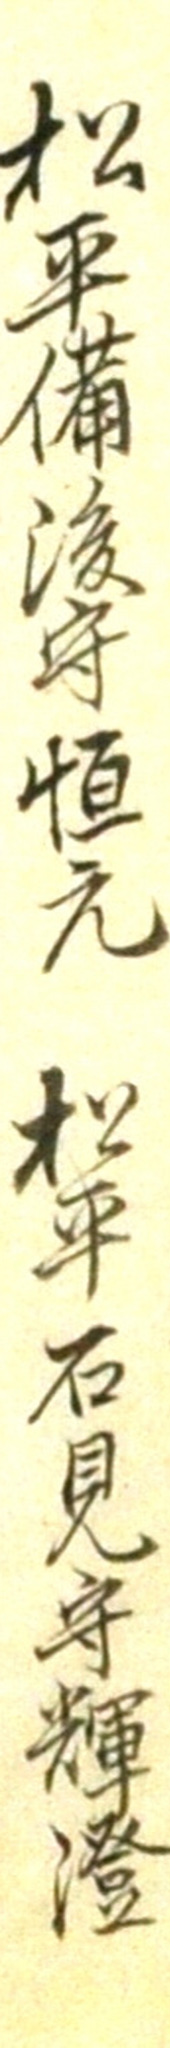松平備後守恒元松平石見守輝澄
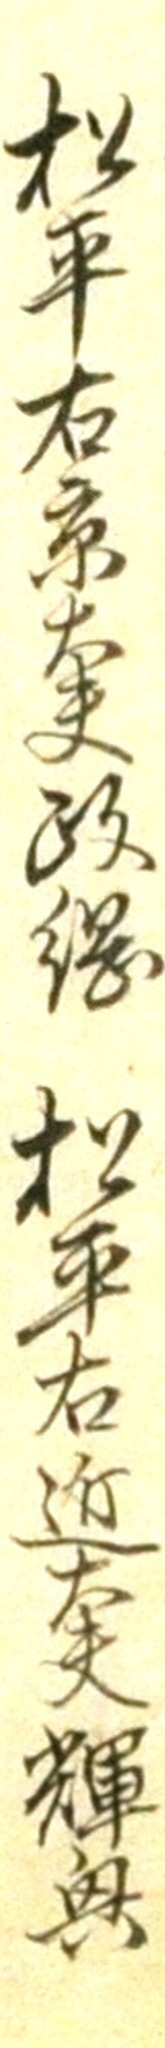松平右京大夫政綱松平右近大夫輝興
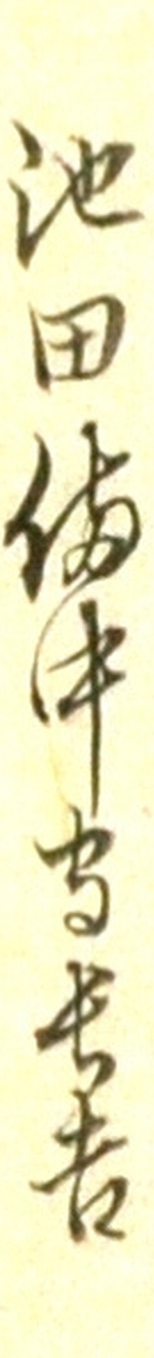池田備中守長吉
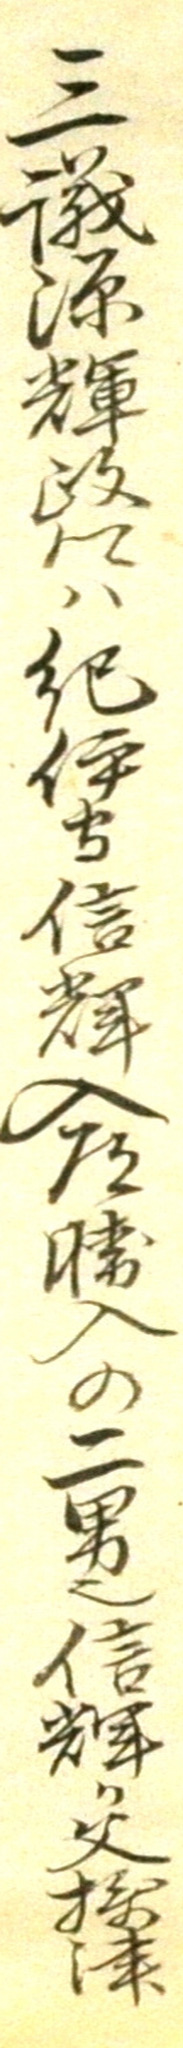三議源輝政卿は紀伊守信輝入道勝入の二男也信輝か父摂津
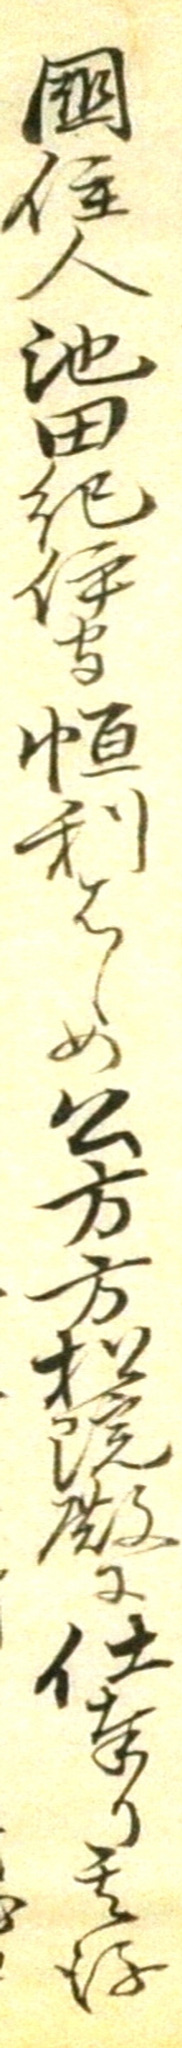国住人池田紀伊守恒利はしめ公方方松院殿に仕奉り其後
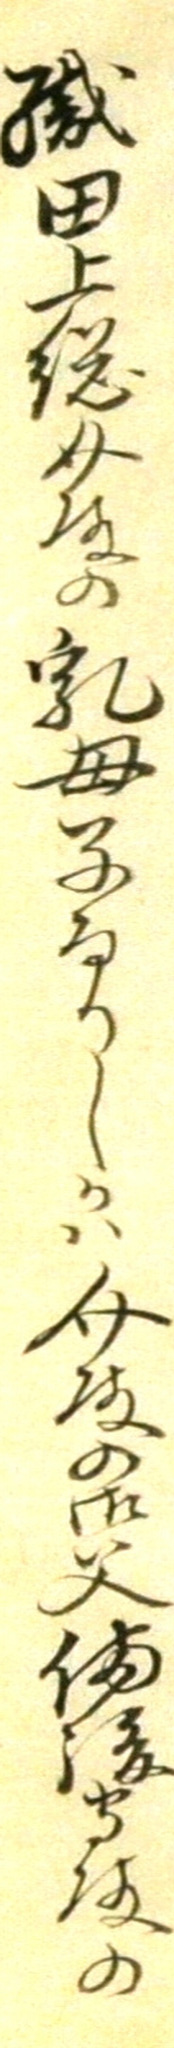織田上総介殿の乳母子なりしかは介殿の御父備後守殿の
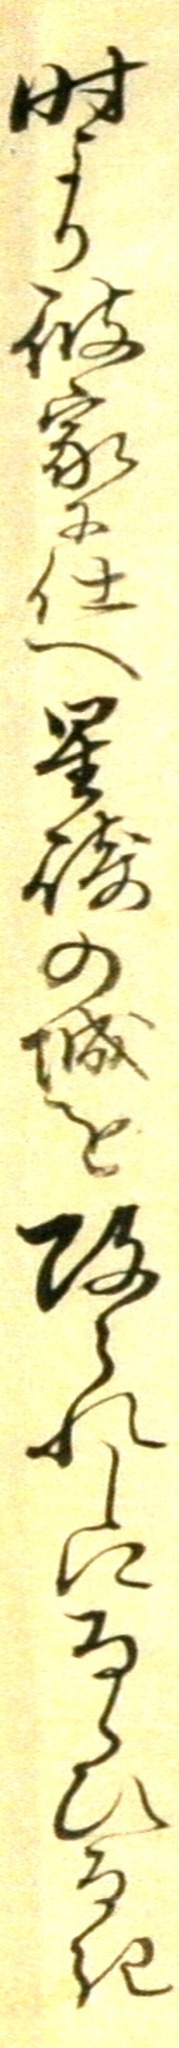時より彼家に仕へ星崎の城を攻られしにならひなき

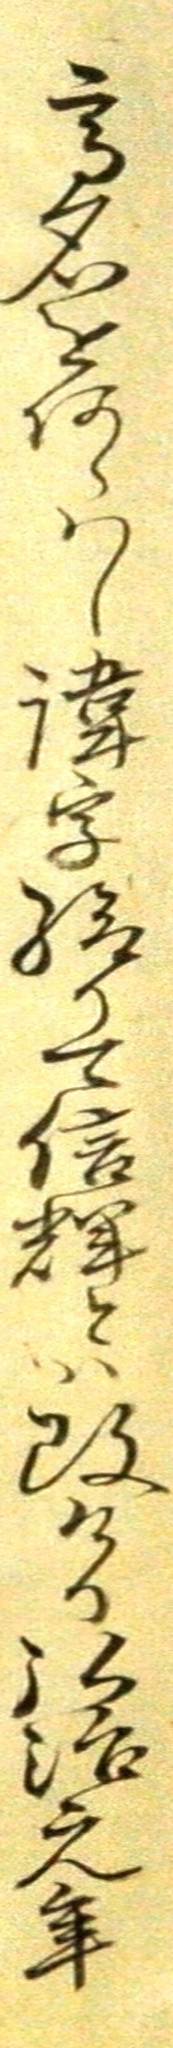高名をあらはし諱字給りて信輝とは改ける弘治元年
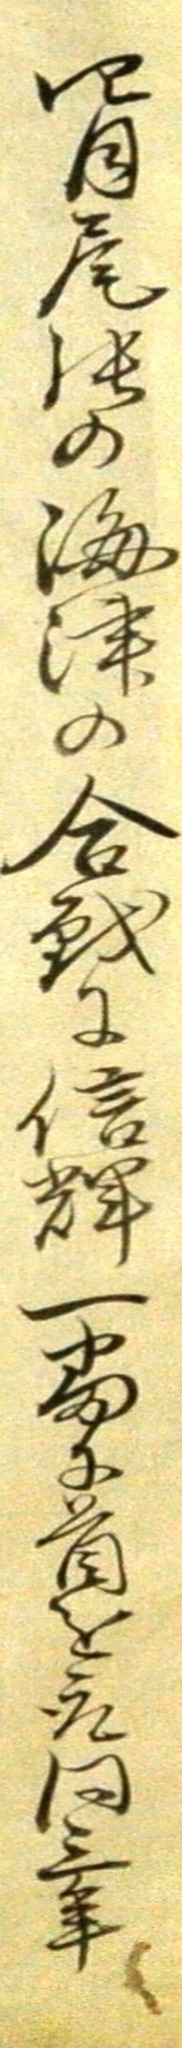四月尾張の海津の合戦に信輝一番に首を取同三年
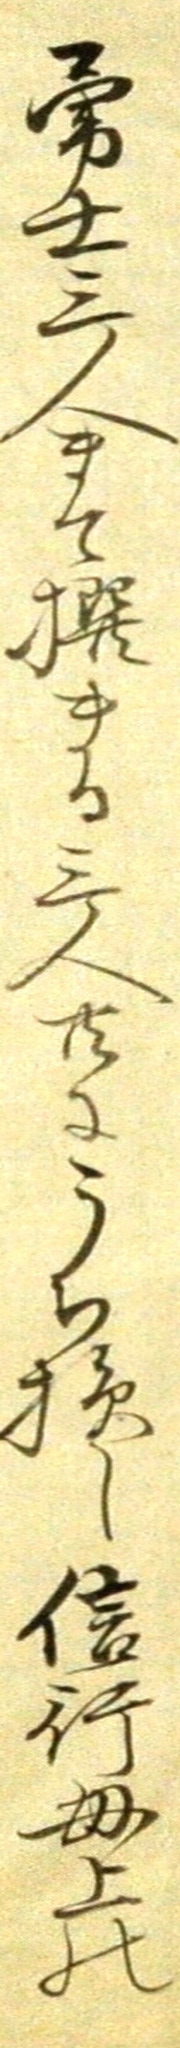勇士三人まて撰まる三人共にうち損し信行母上の
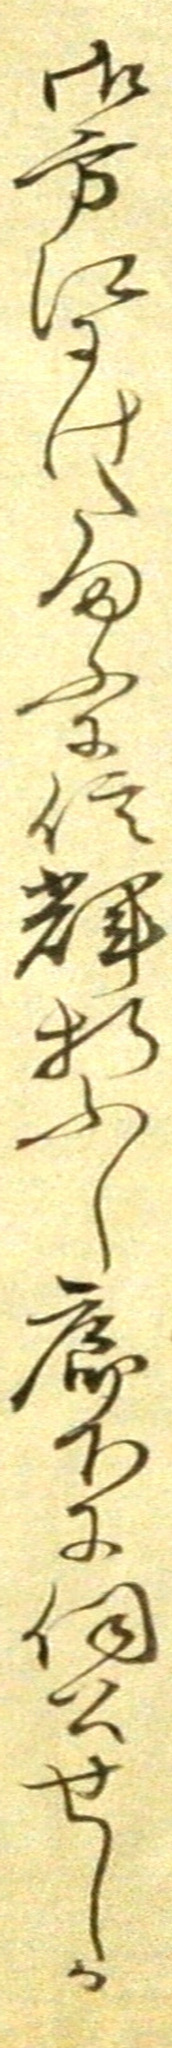御方ににけたまふに信輝折ふし廊下に伺公せしか
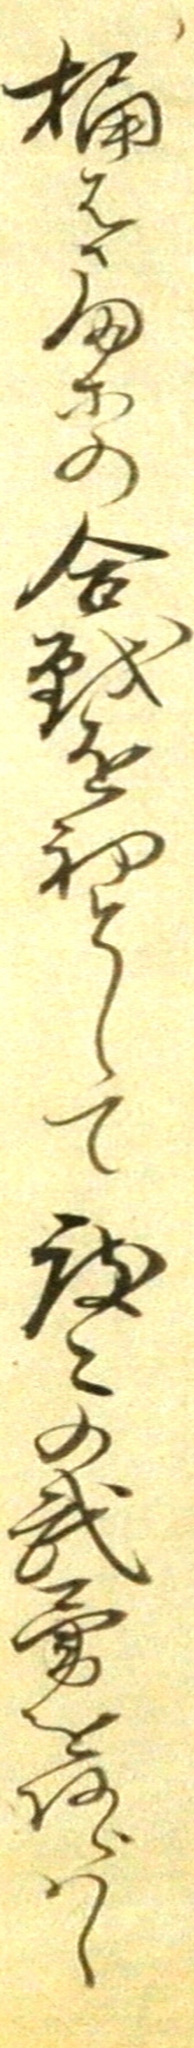桶はさま等の合戦を初として度々の武勇をあらはし
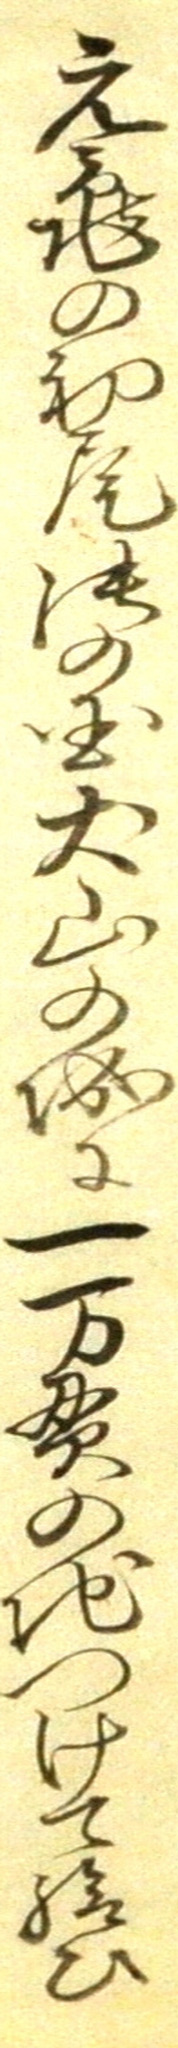元亀の初尾張の国犬山の城に一万貫の地つけて給ひ
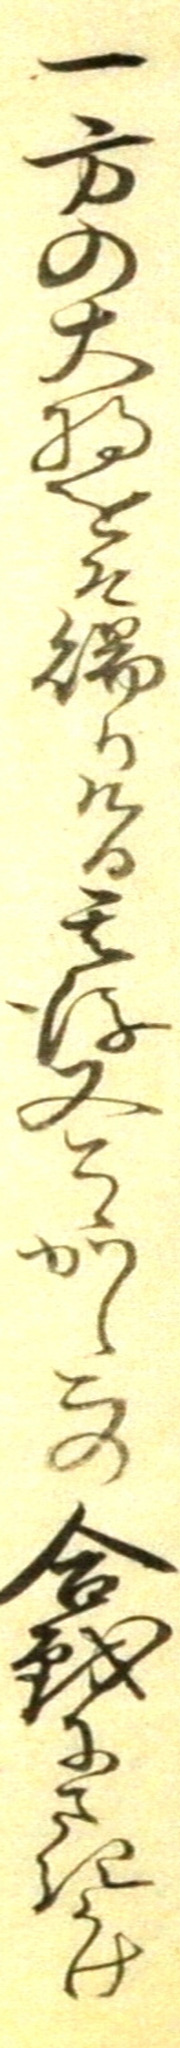一方の大将をそ賜りける其後又こゝかしこの合戦にさきかけ
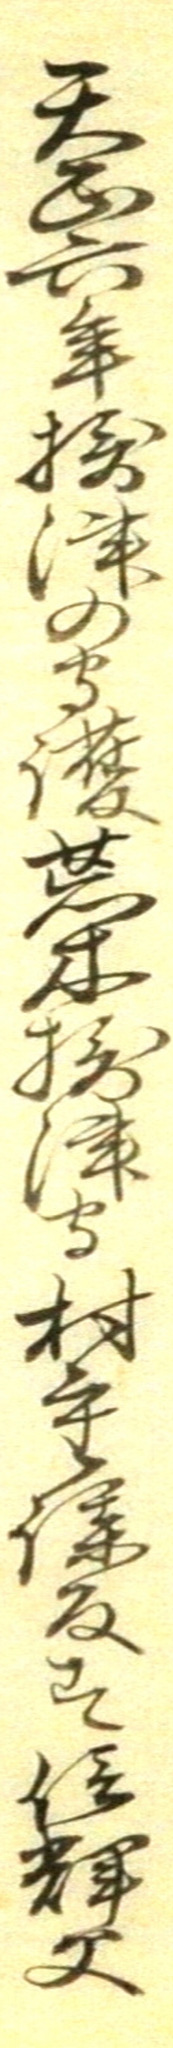天正六年摂津の守護荒木摂津守村重謀反す信輝父
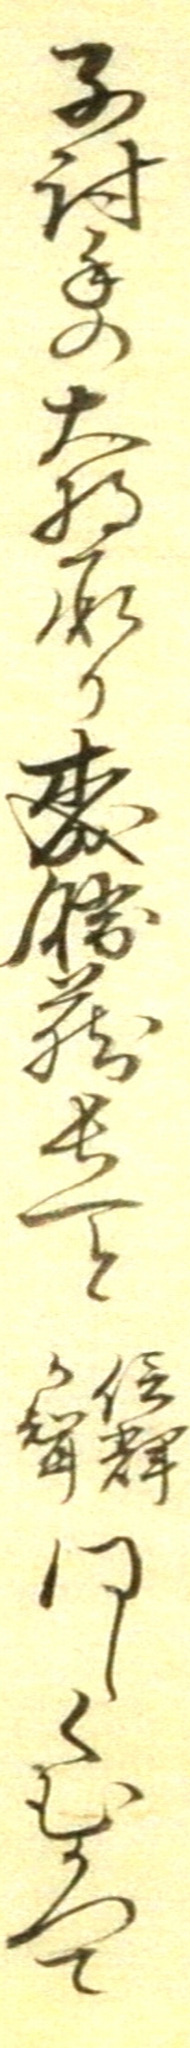子討手の大将承り森勝蔵長一と信輝か聟同しくむかつて
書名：藩翰譜（七・上）
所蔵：伊那市立高遠町図書館・合同会社AMANE
